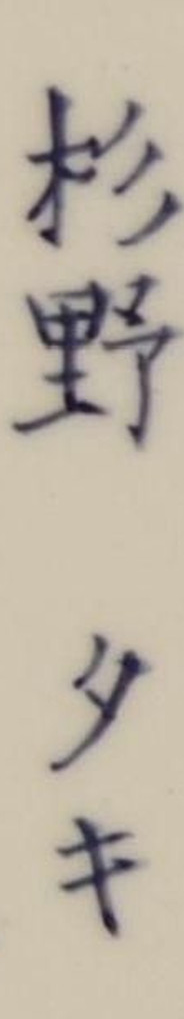杉野タキ
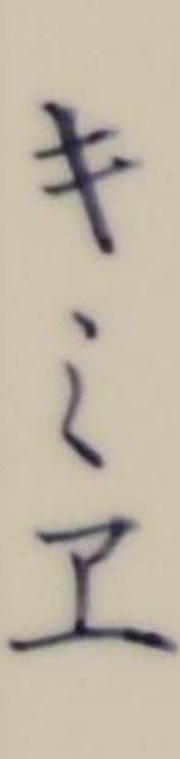キミヱ

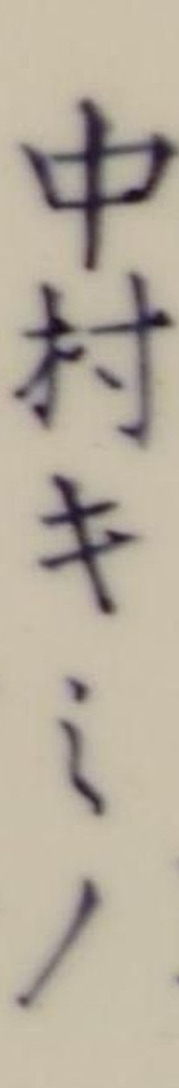中村キミノ
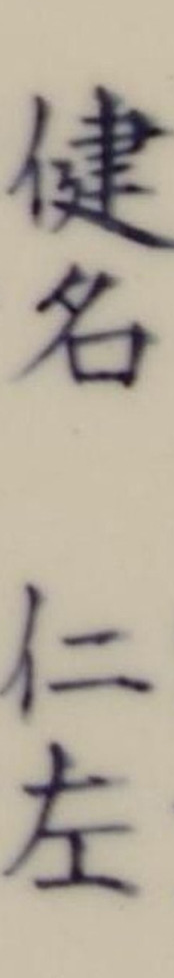健名仁左
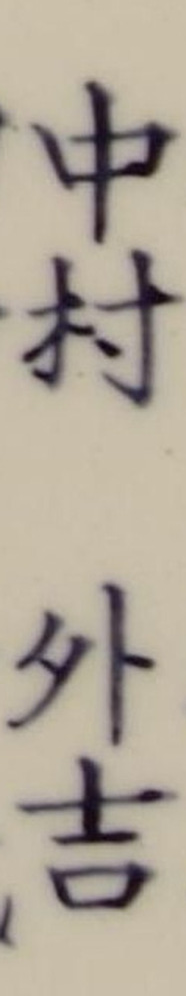中村外吉
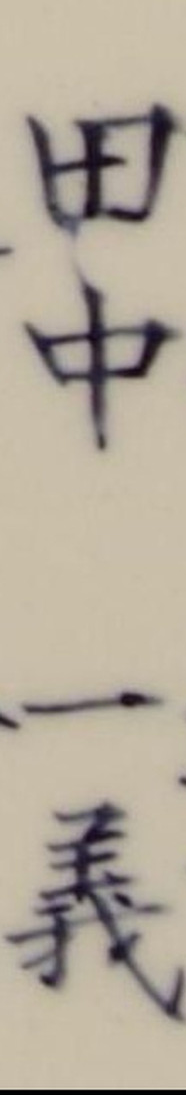田中一義
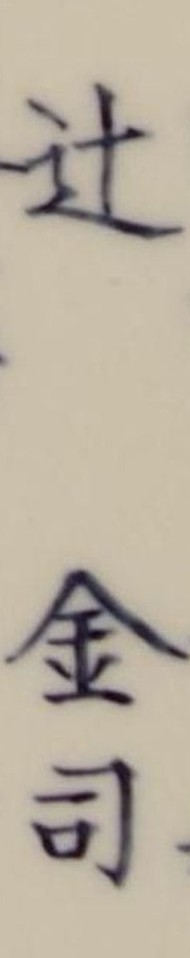辻金司
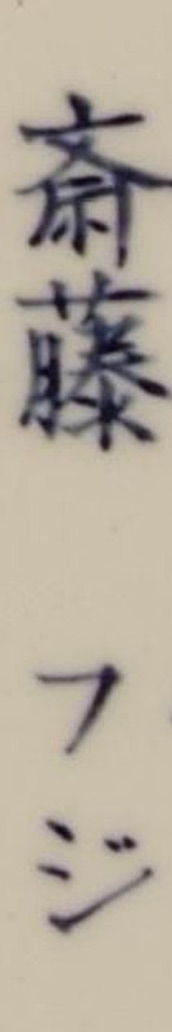斎藤フジ
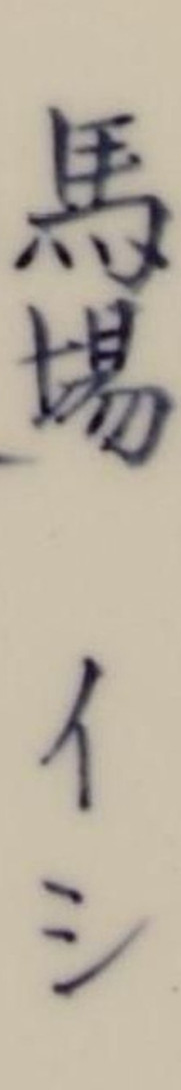馬場イシ
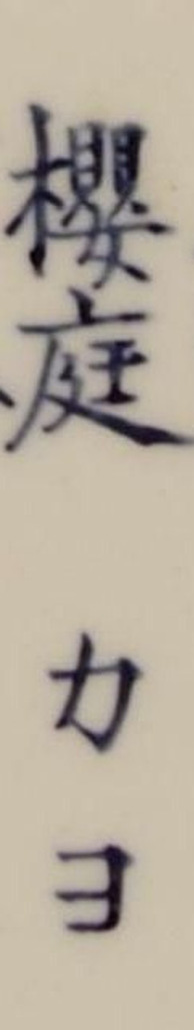桜庭力ヨ
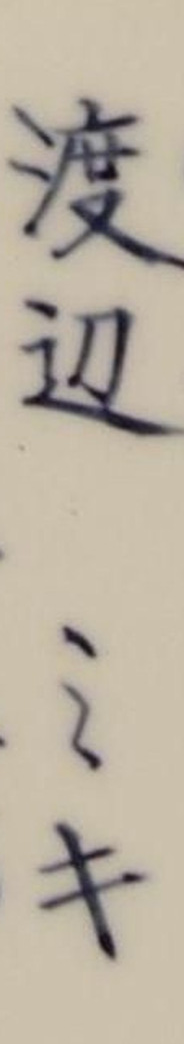渡辺ミキ
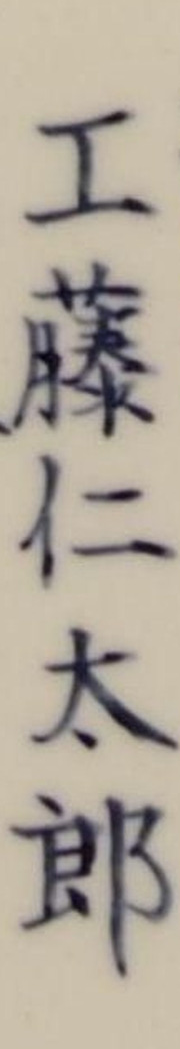工藤仁太郎
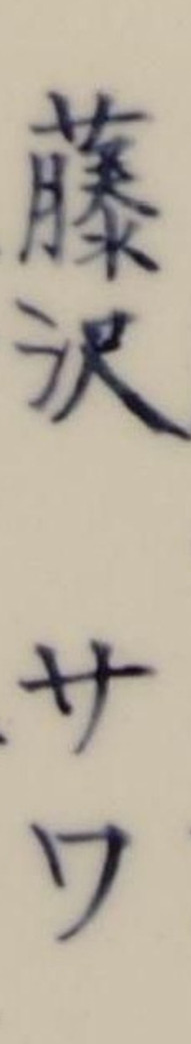藤沢サワ
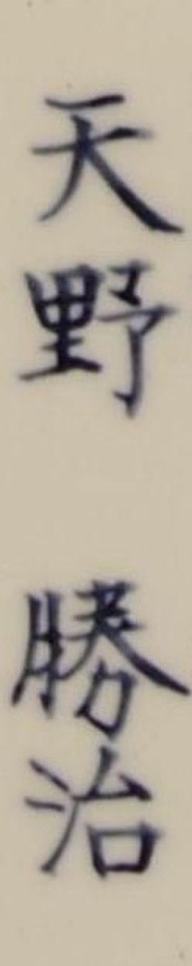天野勝治
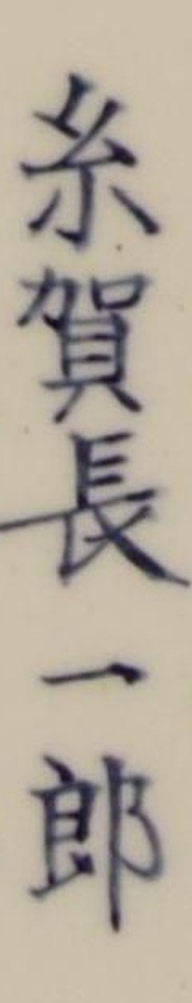糸賀長一郎
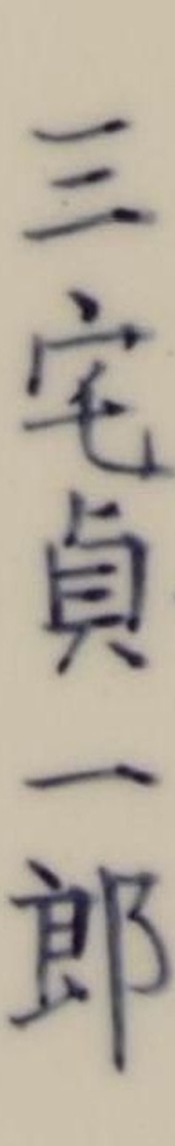三宅貞一郎
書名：E~L
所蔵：高野山金剛峯寺
